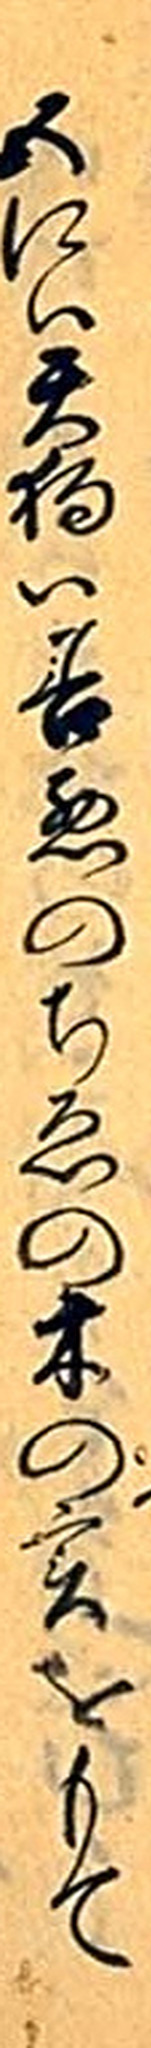五には天狗は善悪のちゑの木の実をもて
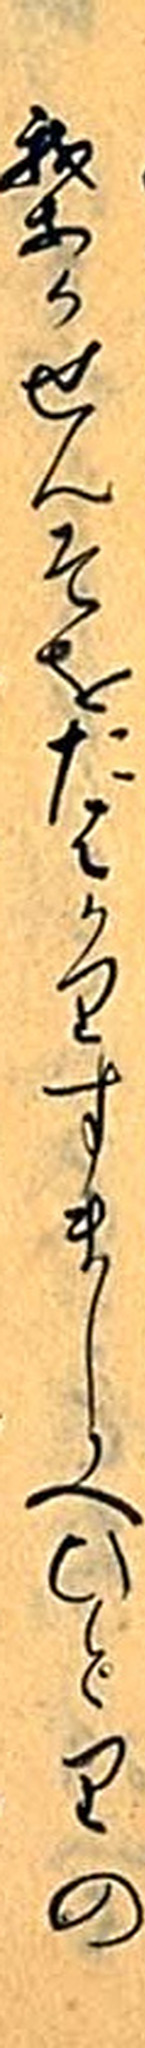我等かせんそをたはかりすまし又ひとりの
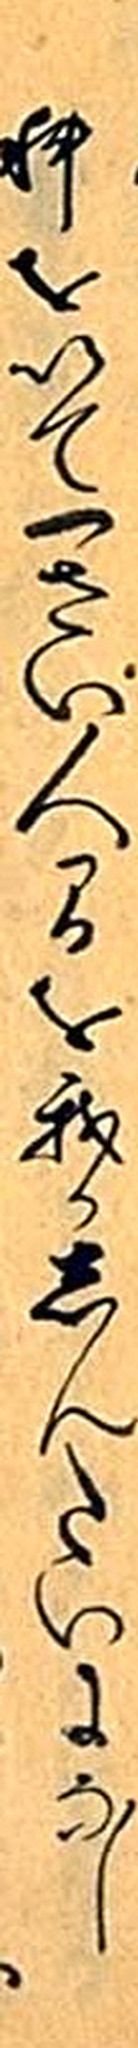科を以て一さい人間を我かしんたいになし
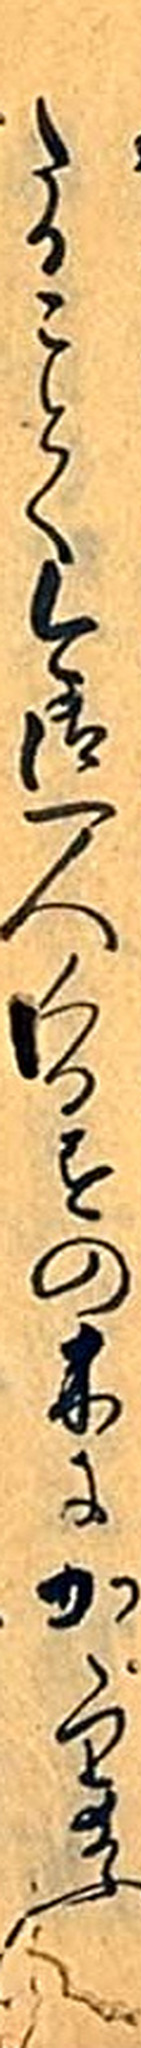たることく今御一人くるすの木にかゝり給ふ
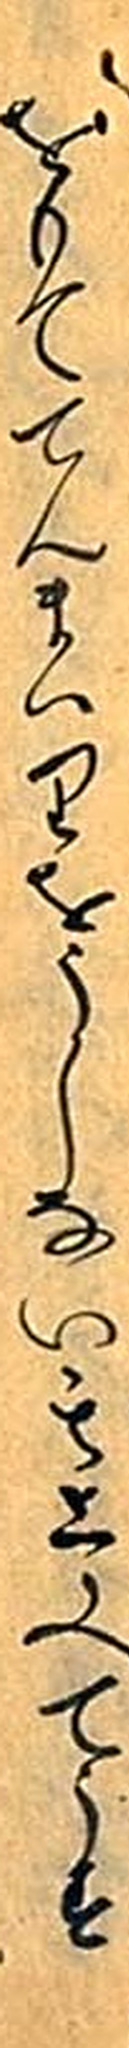をもててんまはりをうしない其上又てうす
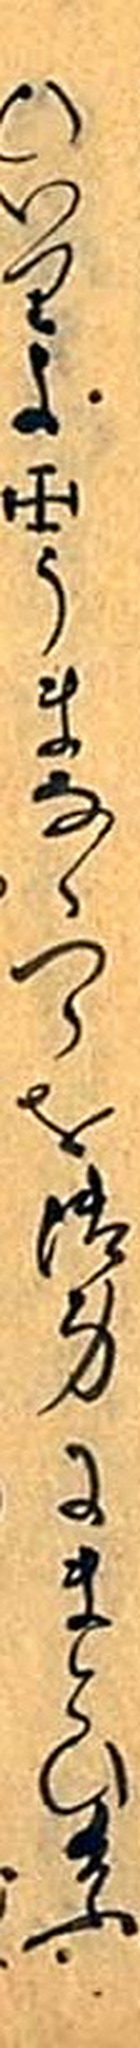ひいりよ☩うまなゝつらを御身にまとひ給ふ
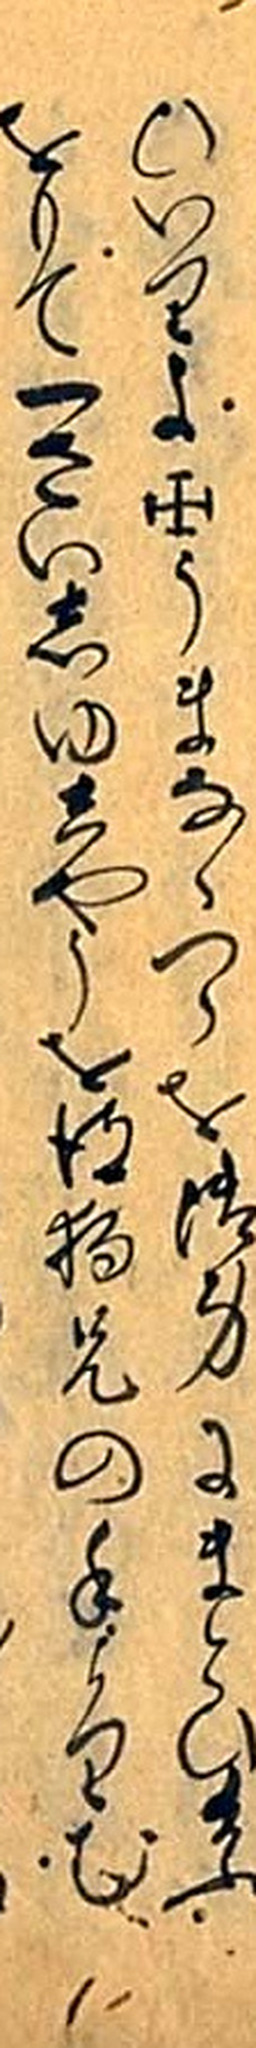をもて一さいしゆしやうを彼狗兄の手よりむ
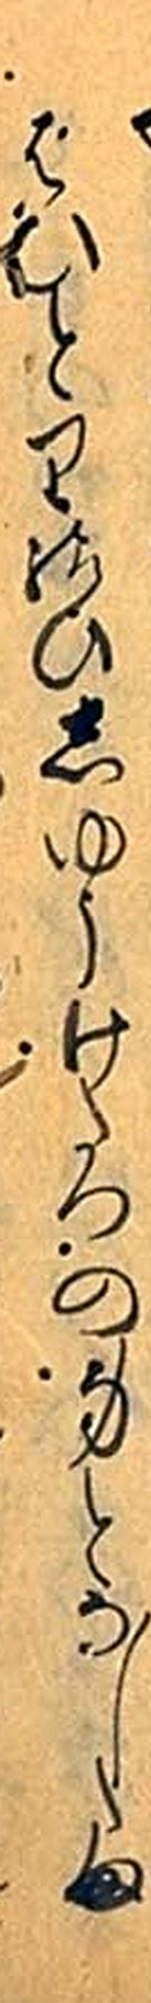はひとり給ひしゆうけたつの身となしたま

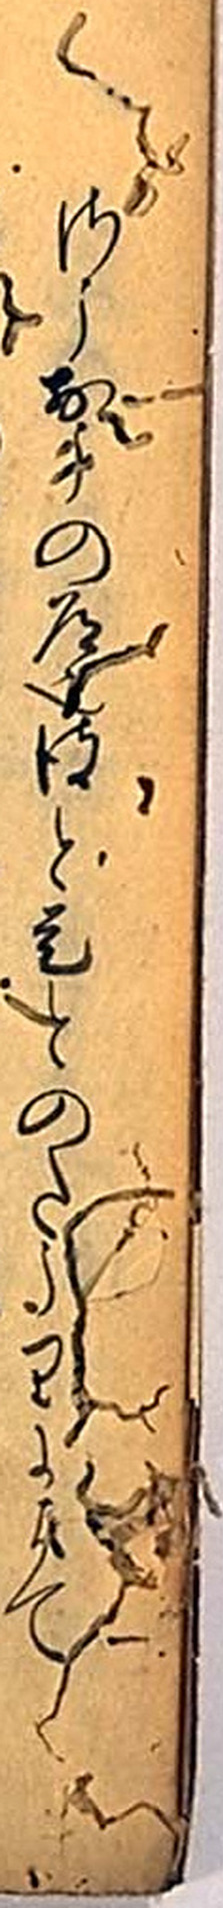さうおうの道也彼と是とのたうりよにて
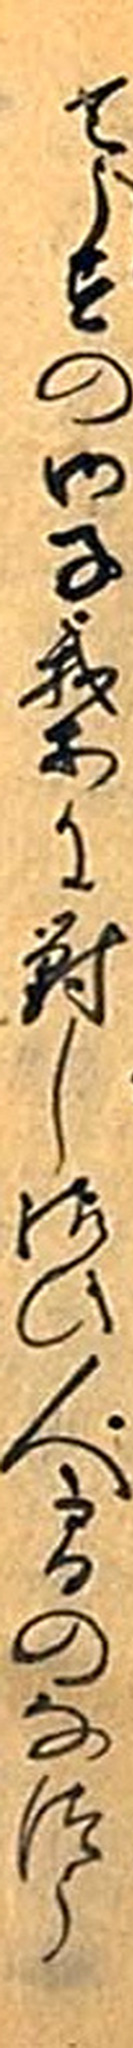てうすの御子我等に対し給ひ人間のなつう
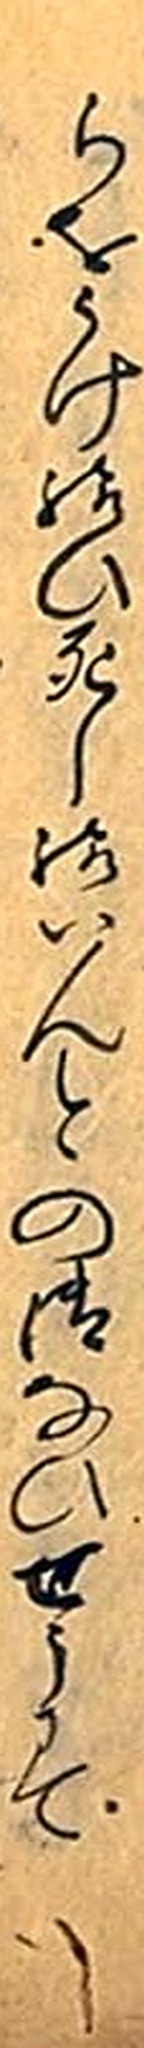らをうけ給ひ死し給はんとの御なひせうにて
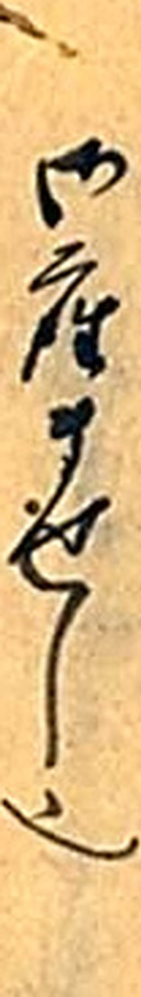御座ませし也
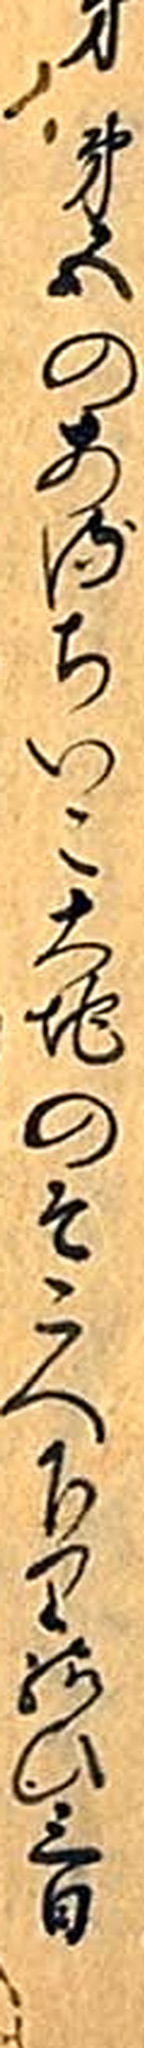弟第五のあるちいこ大地のそこへ下り給ひ三日
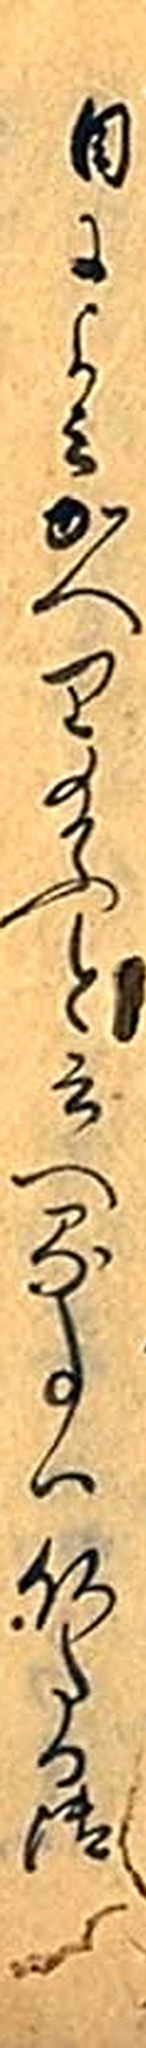目によみかえり給ふと云へる事は何たる御
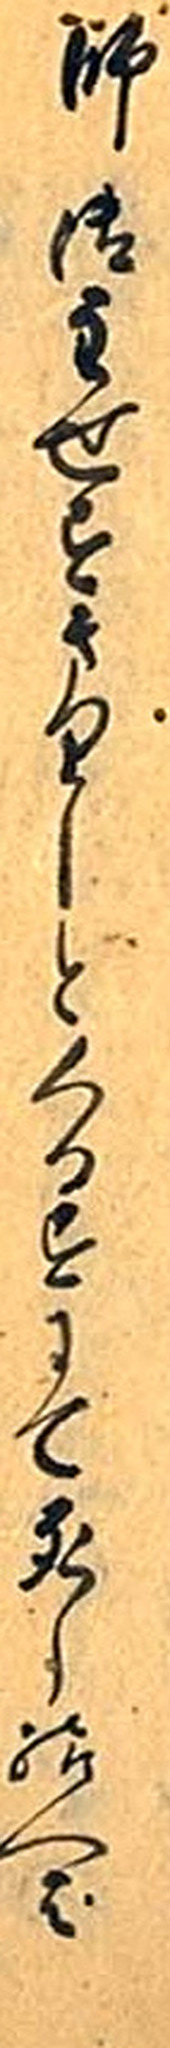師御主せすきりしとくるすにて死し給へは
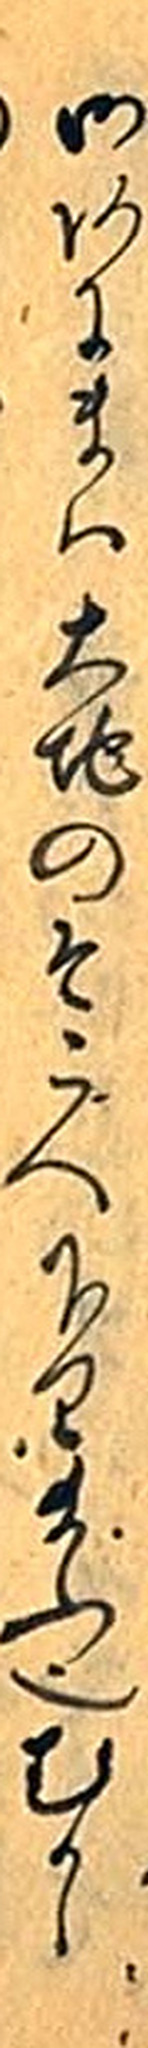御あにまは大地のそこへ下り給ふ也むかし
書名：ドチリナ・キリシタン
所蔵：東京大学総合図書館 / General Library in the University of Tokyo
